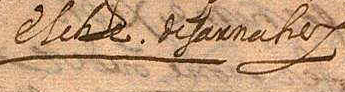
elche de sarnahe
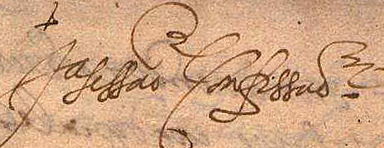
Ja sessaõ Confissaõ
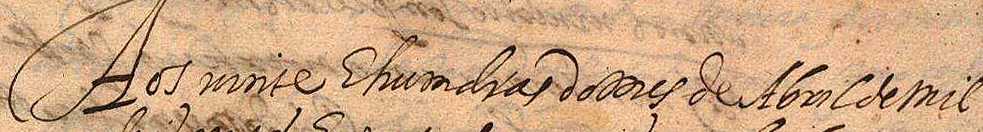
Aos uinte E hum dias do mes de Abril de mil
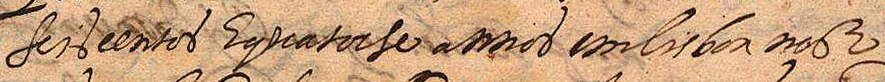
seiscentos e quatorse annos em lisboa nos
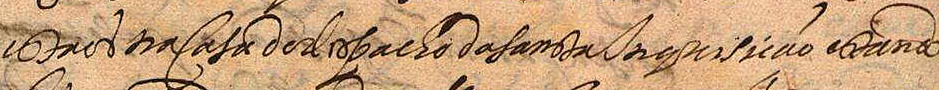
estaos na Casa do despacho da sancta Inquisiçaõ estando
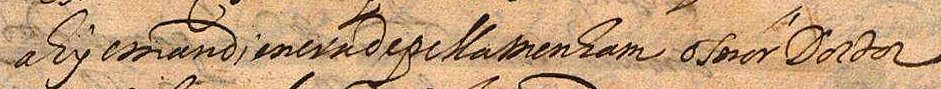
ahy em audiencia de pella menham o snor̄ Doctor
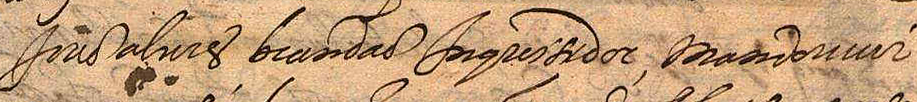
Joaõ alures brandaõ Inquisidor, mandou uir
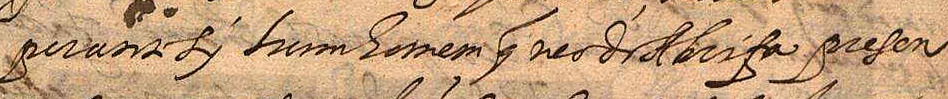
perante sy hum homem q̄ ueo de Abrifa presen
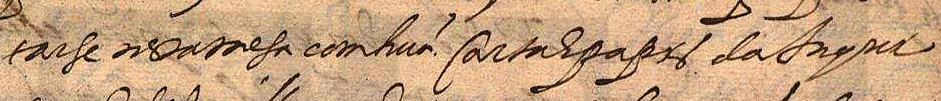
tarse nesta mesa com huā Carta E papis da Inqui
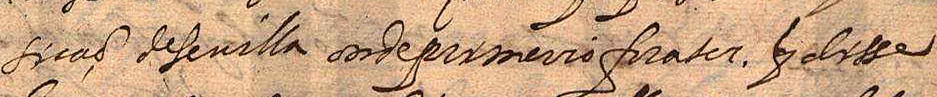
siçaõ de seuilla onde primeiro fora ter. q̄ disse
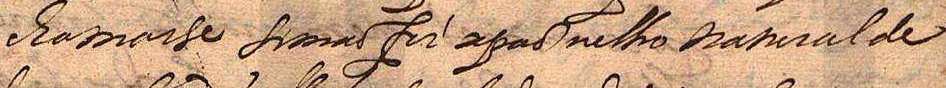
chamarse simaõ frz̄ xpaõ uelho natural de
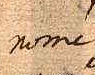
nome
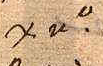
x uo.
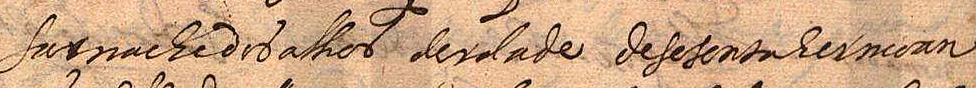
Sarnache dos alhos de idade de sesenta E cinco an
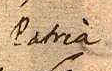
Patria
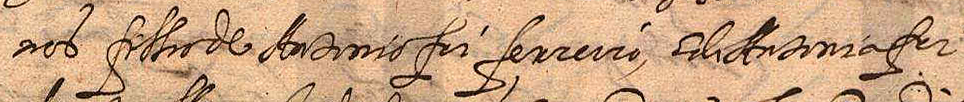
nos filho de Antonio frz̄ ferreiro, E de Antonia frz̄
